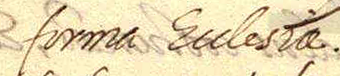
forma Ecclesiæ.
